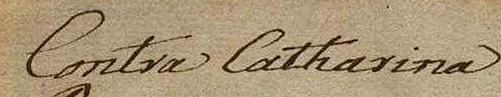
Contra Catharina
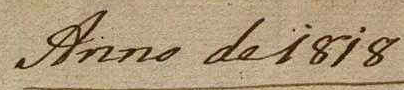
Anno de 1818.
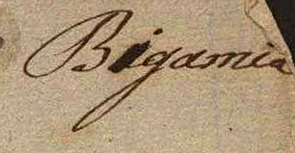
Bigamia
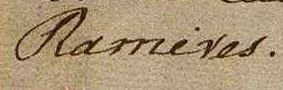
Rameres.
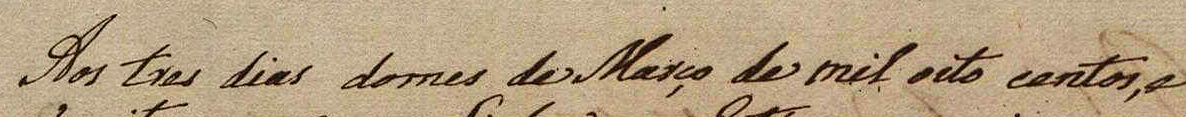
Aos tres dias do mes de Março de mil oitocentos, e
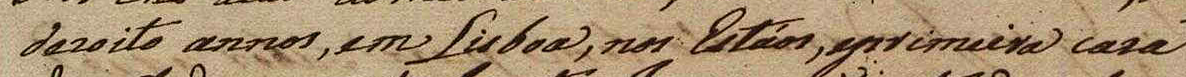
dezoito annos, em Lisboa, nos Estáos, e primeira caza
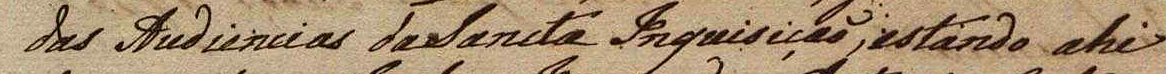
das Audiencias da Sancta Inquisiçaõ, estando ahi
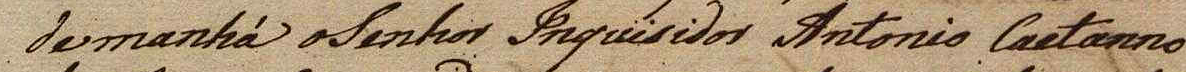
de manhã o Senhor Inquisidor Antonio Caetanno
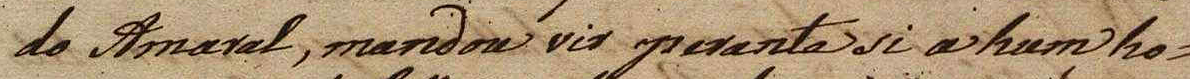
do Amaral, mandou vir perante si a hum ho
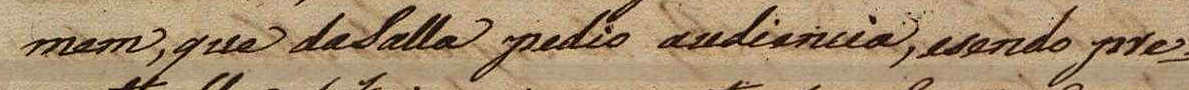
mem, que da Salla pedio audiencia, e sendo pre
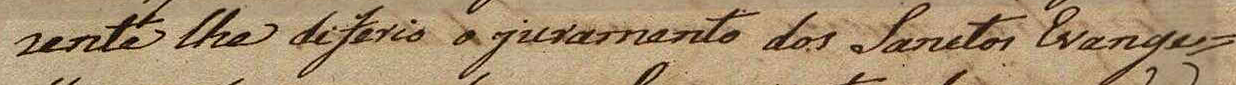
zente lhe diferio o juramento dos Sanctos Evange
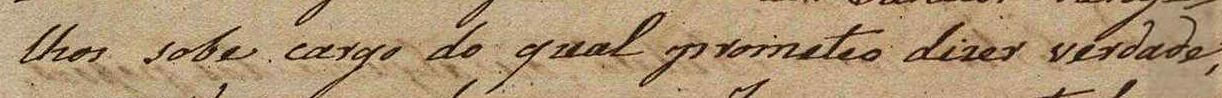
lhos sobe cargo do qual prometeo dizer verdade,
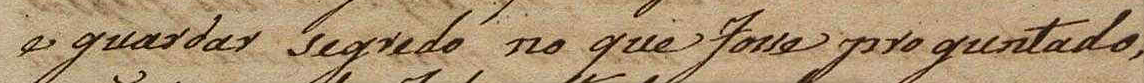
e guardar segredo no que fosse proguntado,
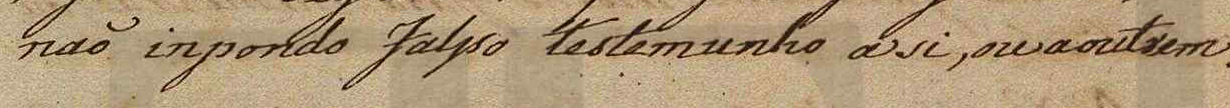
naõ inpondo falsso testemunho a si, ou a outrem
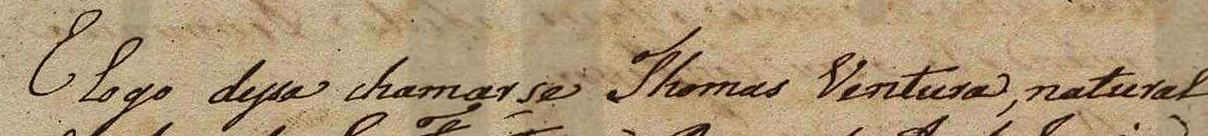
E logo disse chamarse Thomas Ventura, natural
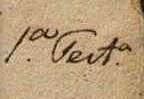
1.a Test.
